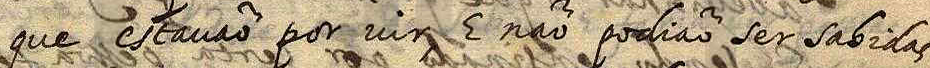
que estauaõ por vir e naõ podiaõ ser sabidas
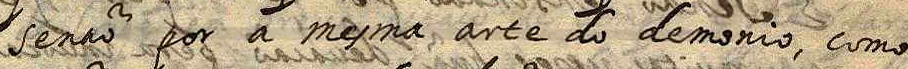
senaõ por a mesma arte do demonio, como
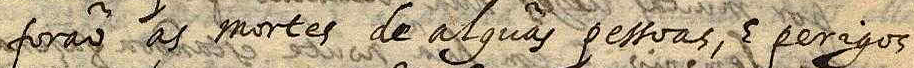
foraõ as mortes de alguās pessoas, e perigos
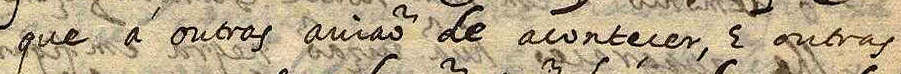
que á outras auiaõ de aconteçer, e outras
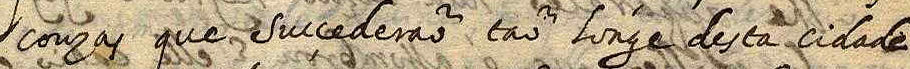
couzas que sucçederaõ taõ longe desta cidade
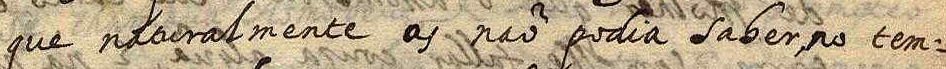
que naturalmente as naõ podia saber, no tem
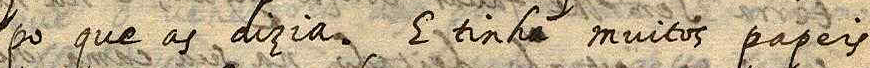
po que as dizia. e tinha muitos papeis
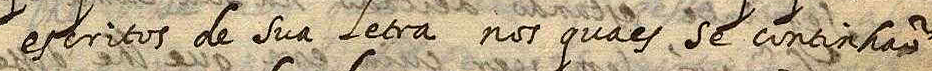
escritos de sua letra nos quaes se continhaõ
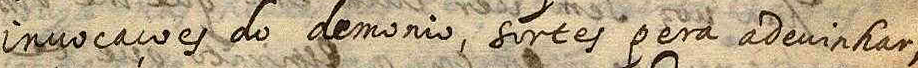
inuocaçoes do demonio, sortes pera adeuinhar,
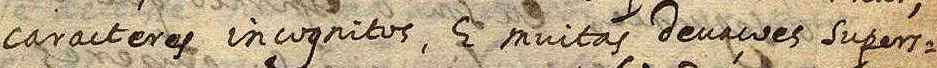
caracteres incognitos, e muitas deuaçoes supers
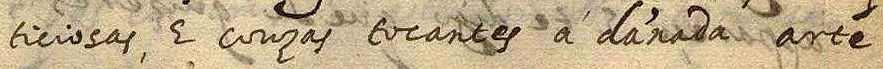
ticiosas e couzas tocantes á danada arte
